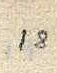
18
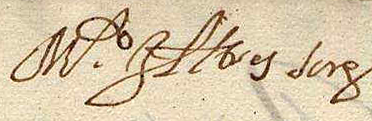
M.to Illtres Sores
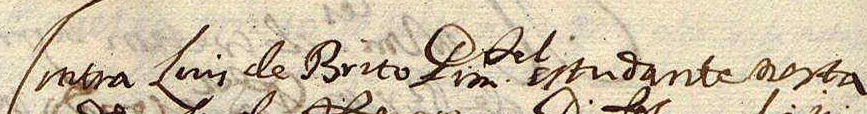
Contra Luis de Brito Pim.tel Estudante nesta
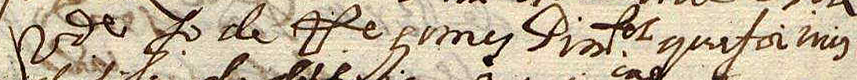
V.de f.o de V.te Gomes Pim.tel que foi iuis
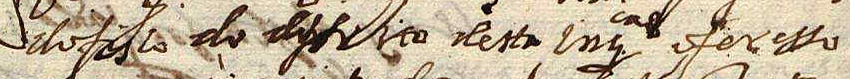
do fisco do distrito desta Inq.çaõ oferesso
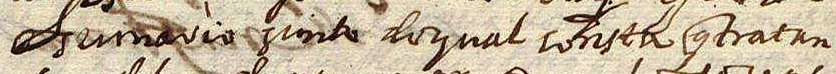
o sumario junto do qual consta q̄ tratan
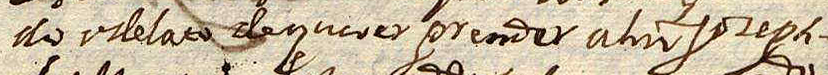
do o delato de querer prender a hū Jozeph
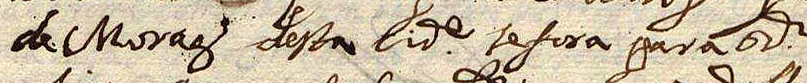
de Moraes desta Cid.e se fora para o d.o
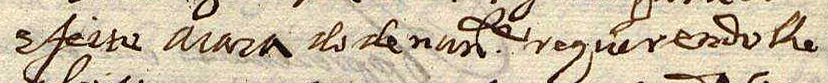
Efeito a caza do denun.te requerendolhe
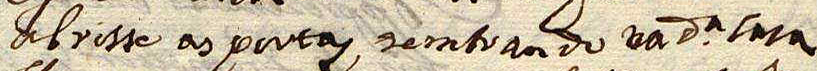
abrisse as portas, E emtrando na d.a caza
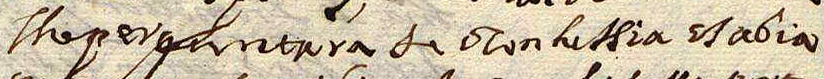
lhe perguntara se o conhessia E sabia
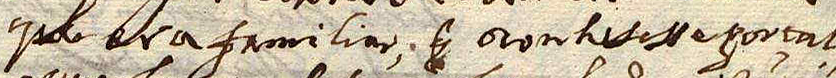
que era familiar, q̄ o conhesesse por tal
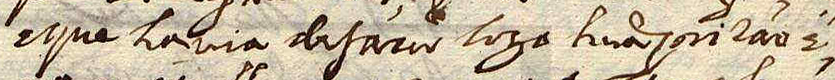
E que hauia de fazer logo huā prizaõ E
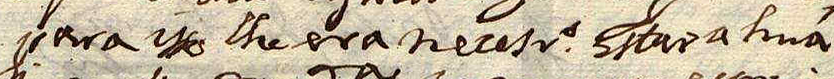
para isso lhe era necesr.o Estar a huā
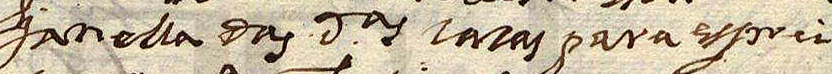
janella das d.as cazas para Esprei
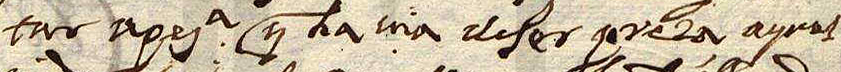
tar a pes.a q̄ hauia de ser preza, a qual
